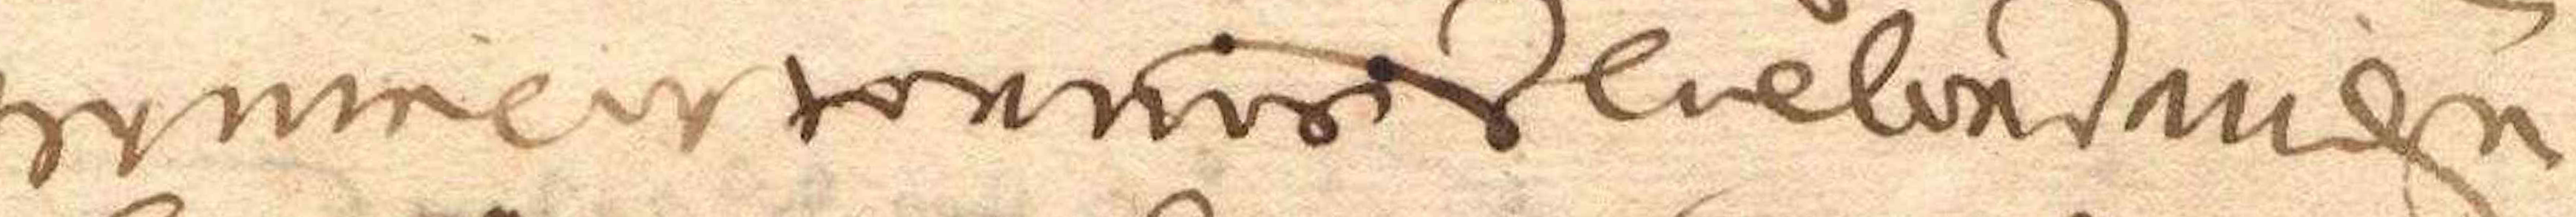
trynta e oyto anōs ē lixboa ē audja
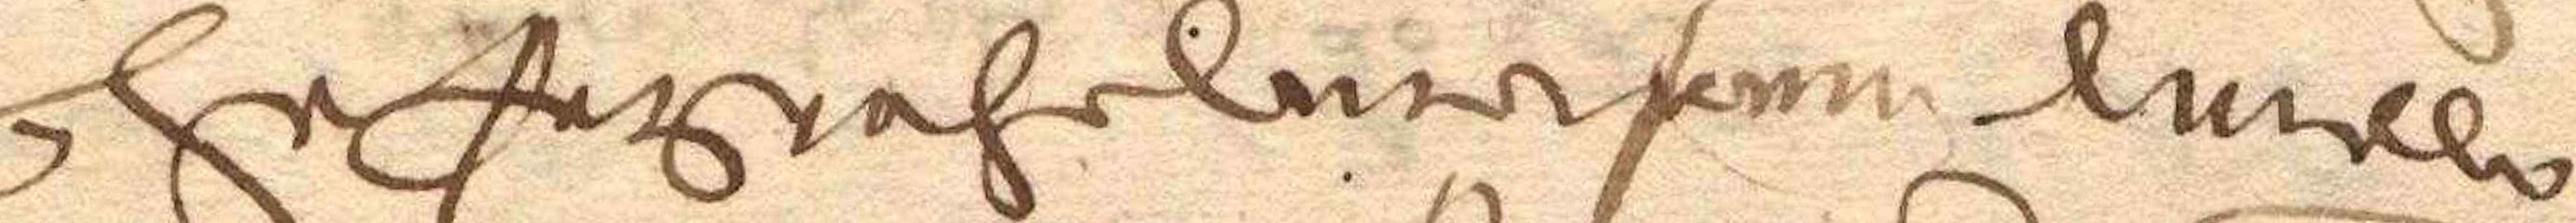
q̄ hi fazya ho doutor Joam de mello
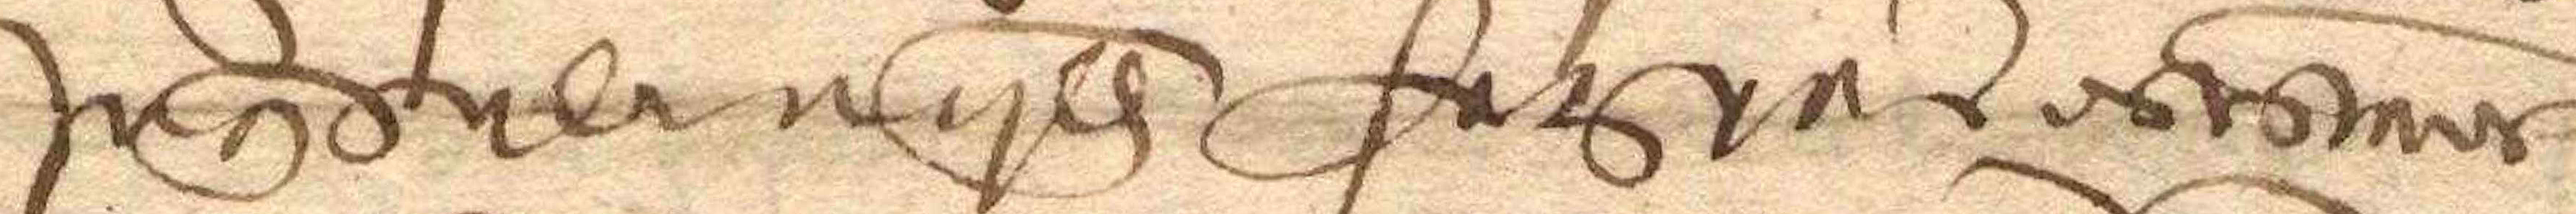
Jnq̄sydor a q̄ll fazya ē os estaos
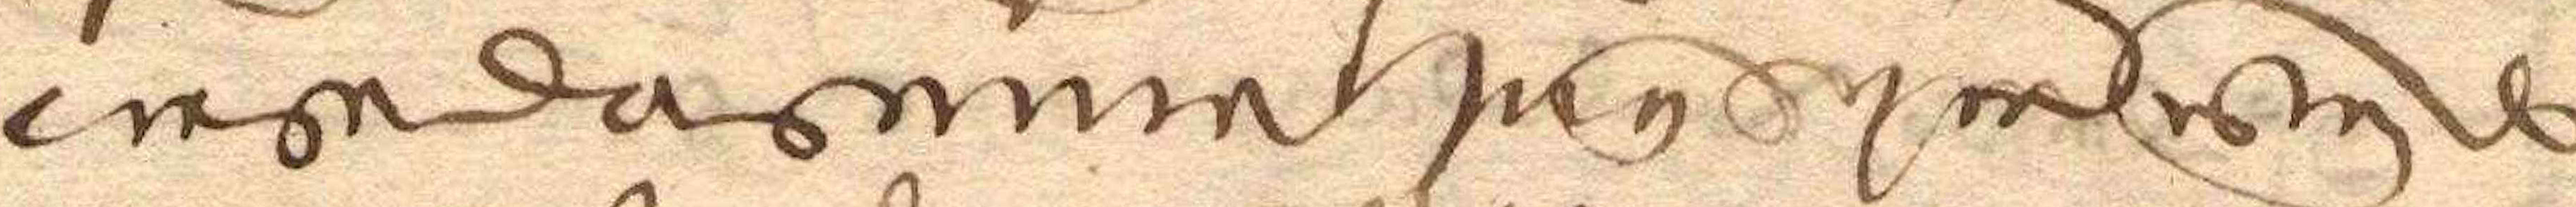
e casa da santa Jnq̄sycā ēstado
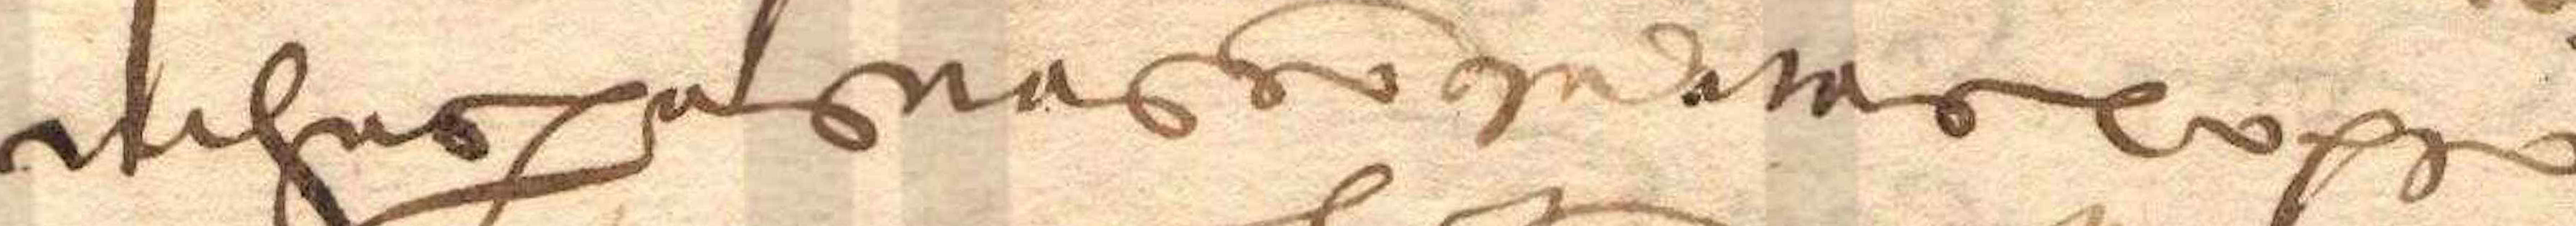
munhas ꝑa suas c̄otraditas e o pro
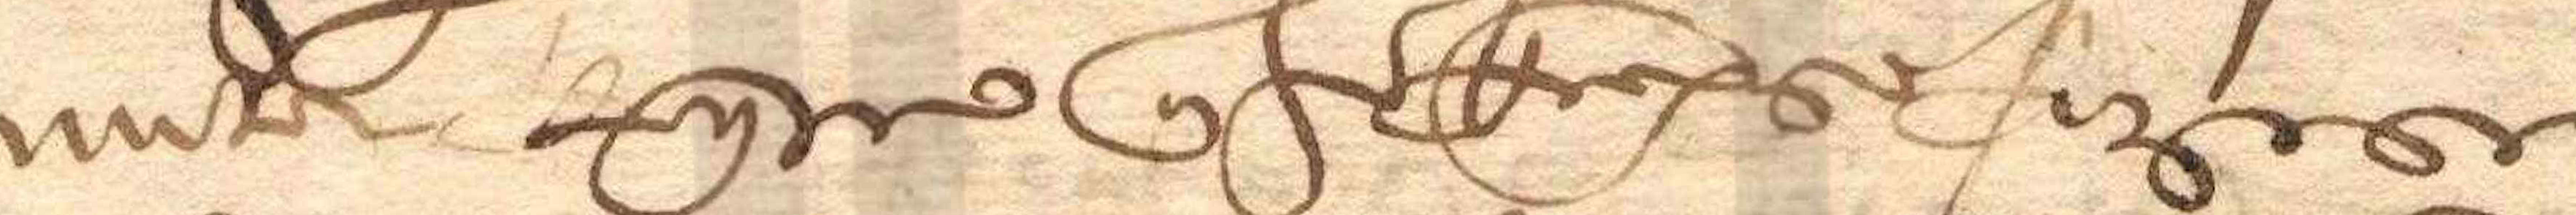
motor Req̄reo q̄ ho Reo p̄so fizese
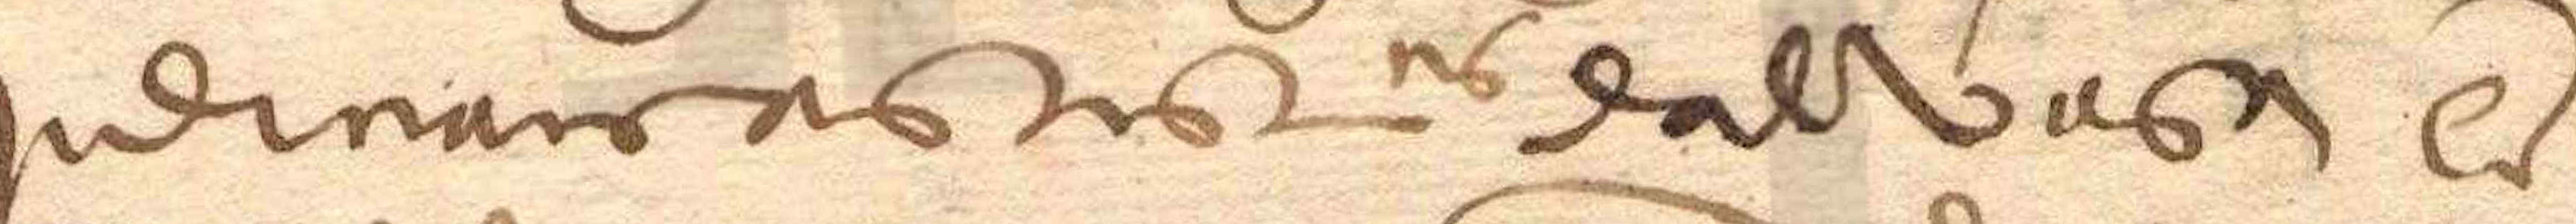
Judiciaes as testas da devasa e ē
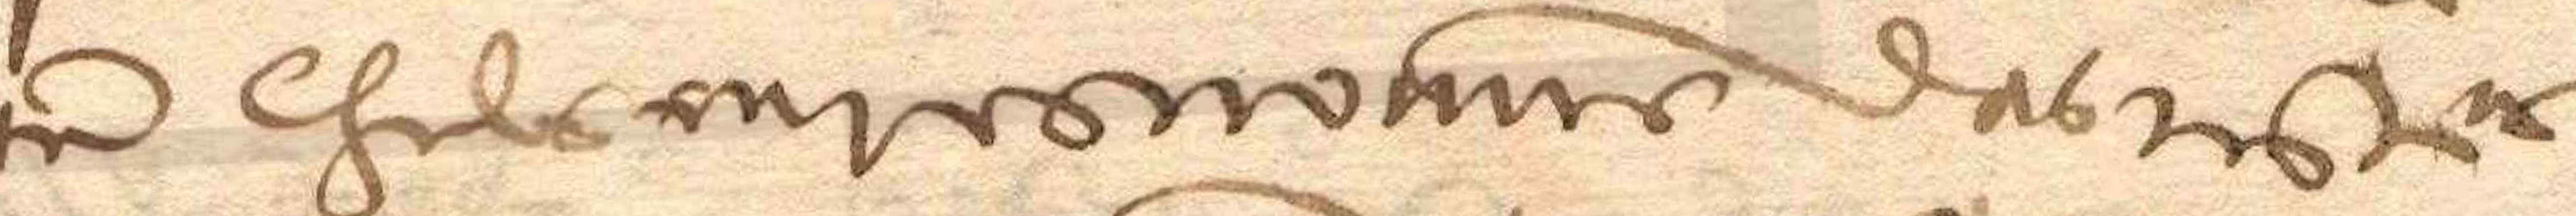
tā lhe desem os nomes das testas
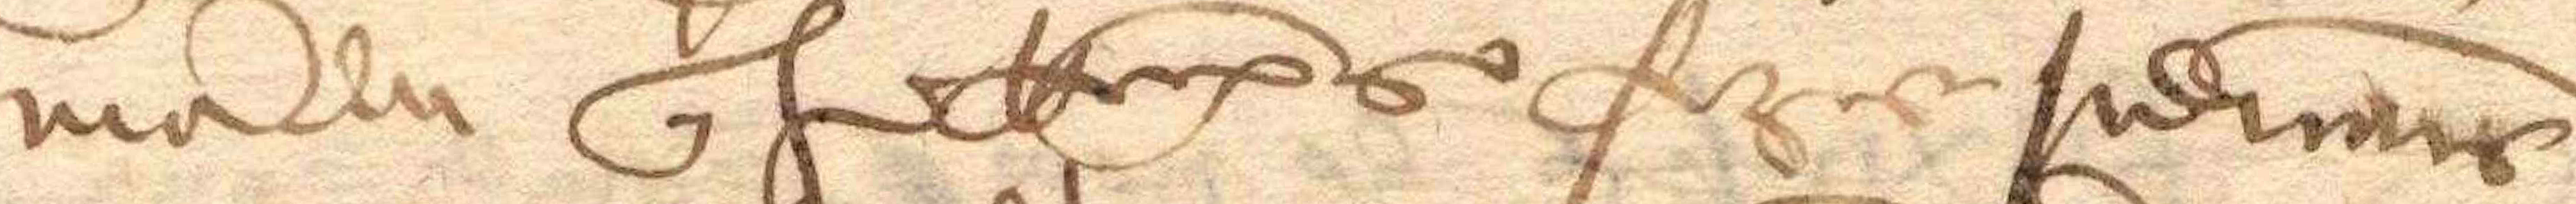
mādou q̄ ho Reo p̄so fezese Judicaes
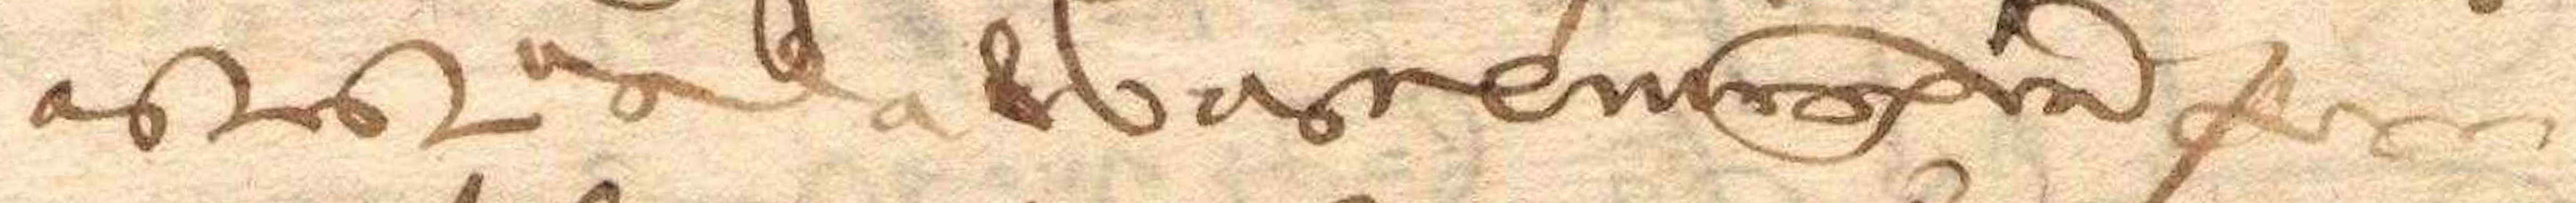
as testas da devasa e eu esp̄vā fose
